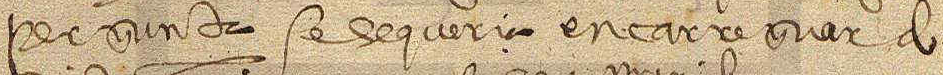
pergunta se se queria encarreguar do
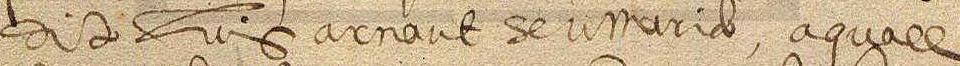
dito Luis arnaut seu marido, a quall
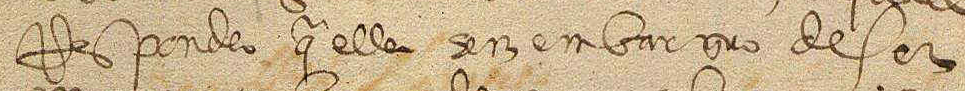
Respondeo q̄ ella sem embarguo de ser
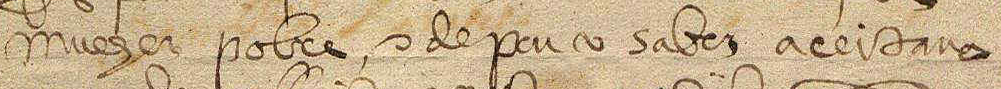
mulher pobre, e de pouco saber aceitaua
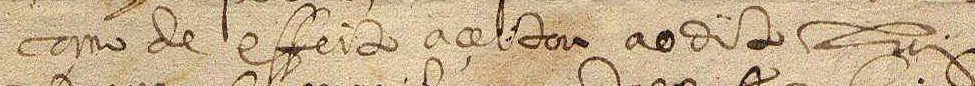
como de effeito aceitou ao dito Luis
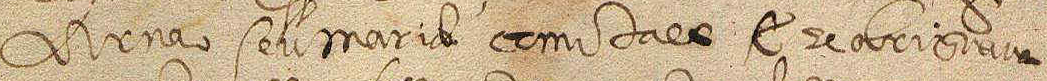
Arnao seu marido como tall E se abriguaua
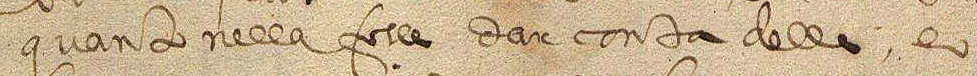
quanto nella fosse dar conta delle, e o
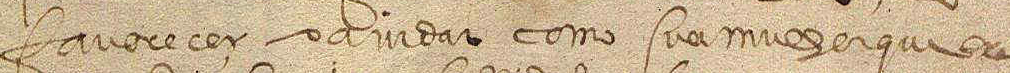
fauorecer e aiudar como sua mulher que era
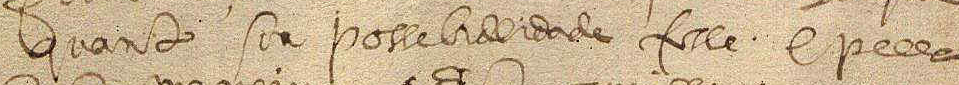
quanto sua possebillidade fosse. e pella
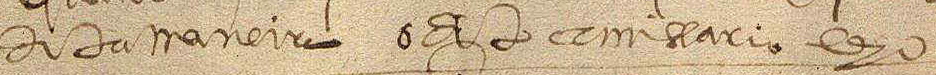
dita maneira o dito comissario lho
